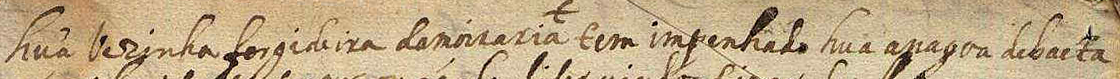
huā Vezinha forgideira da moiraria tem impenhado hua anagoa de baeta
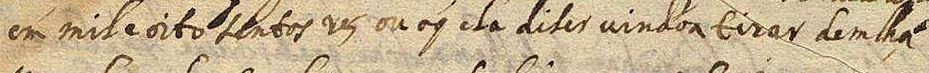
em miL e oitosentos res ou o q̄ ela diser uindo a tirar demlha
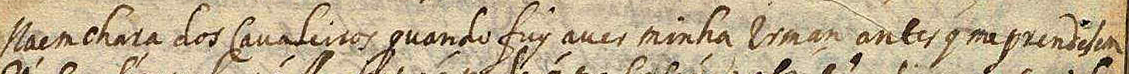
Na emchara dos Caualeiros quando fuy a uer minha Irman antes q̄ me prendesem
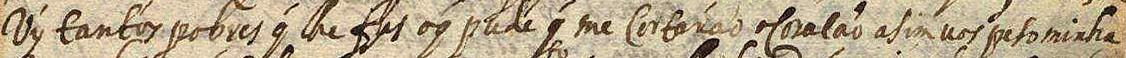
Vy tantos pobres q̄ lhe fis o q̄ pude q̄ me Cortaraõ o CoraÇaõ asim uos peso minha
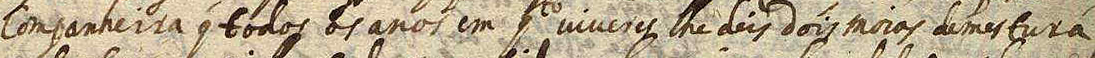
Companheira q̄ todos os anos emqto uiueres lhe deis dois moias de mestura
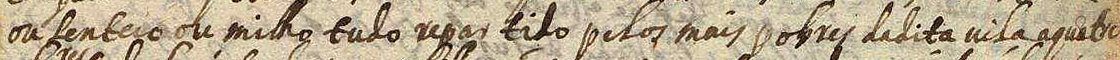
ou senteio ou milho tudo repartido peLos mais pobres da dita uiLa a quatro
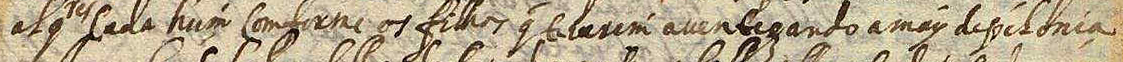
aLqres Cada hum̄ Comforme os filhos q̄ tiurem auentegando a may de péLonia
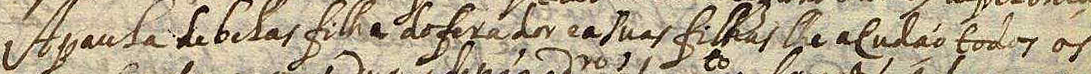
A pauLa de beLas filha do ferador e a suas filhas lhe aCudão todos os
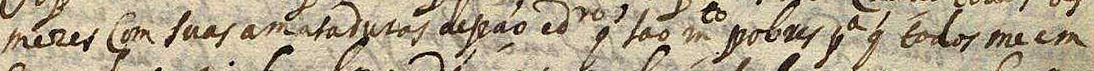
mezes Com suas amasaduras de pão e dro q̄ sao mto pobres pa q̄ todos me em
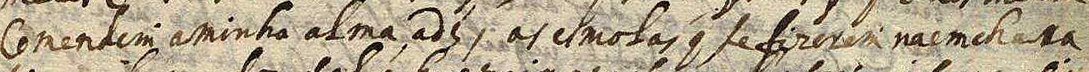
Comendem a minha aLma a ds̄, as esmoLas q̄ se fizerem na emchara
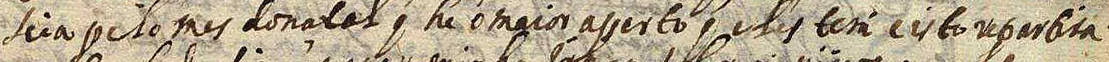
seia pelo mes do nataL q̄ he o maior aperto q̄ eles tem e isto repartira
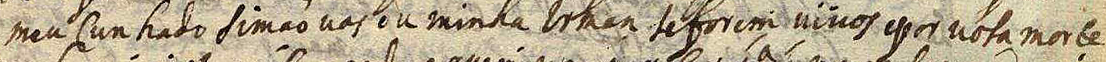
meu Cunhado Simaõ uas ou minha Irman se forem uiuos e por uosa morte
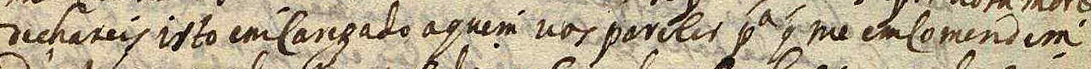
dechareis isto emCaregado a quem uos pareCer pa q̄ me emComendem
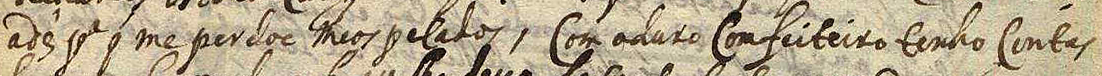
a ds̄ pa q̄ me perdoe meos peCados, Com o duro Comfeiteiro tenho Contas
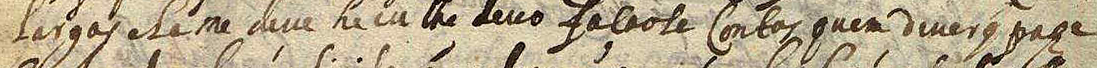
Largas eLe me deue he eu lhe deuo faCaose Contas quem deuer q̄ page
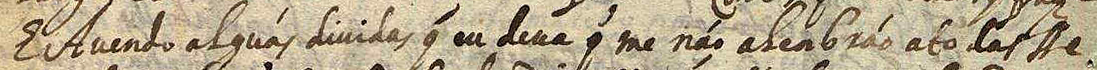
E Auendo aLguās diuidas q̄ eu deua q̄ me naõ aLenbrão a todas sse
